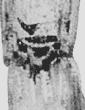曰
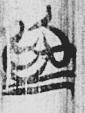爲
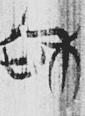和
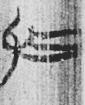於
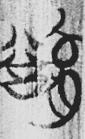豫
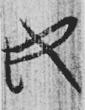女（如）
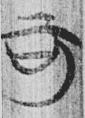可（何）
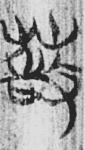{艸告攴}（曹沫）
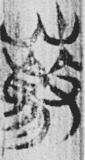{艸目勿攴}（沫）
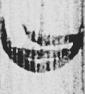曰
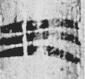三
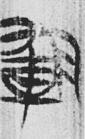軍
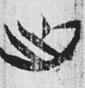出
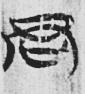君
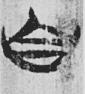自
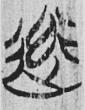○（率）
